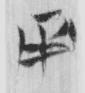甬
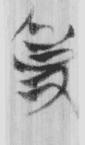事
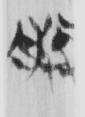朕
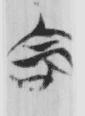命
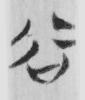谷
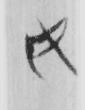女
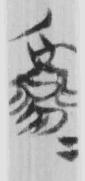{㲋白水}
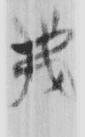弗
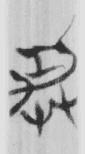{功廾}
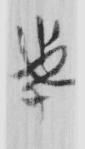我
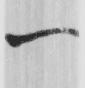一
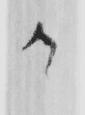人
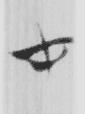才
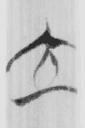立
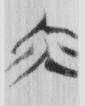亦
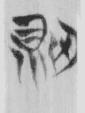則
